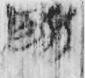所
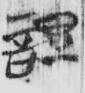○（屬）
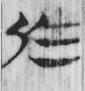於
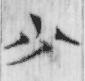少
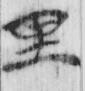里
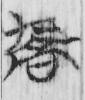喬
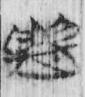○（舉）
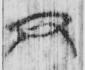尹
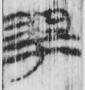○（羽）
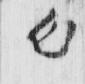巳
